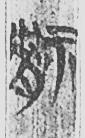禍
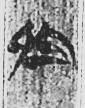於
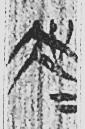吳=
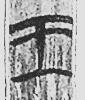王
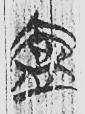盍
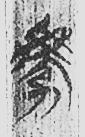{虎力}
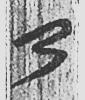乃
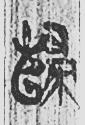{𡴎帚}
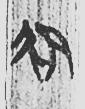卲
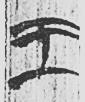王
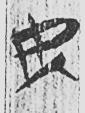𡚦
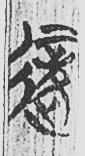復
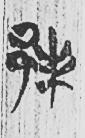邦
